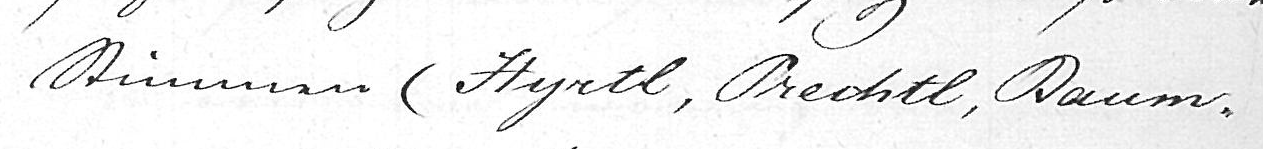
Stimmen (Hyrtl, Prechtl, Baum-
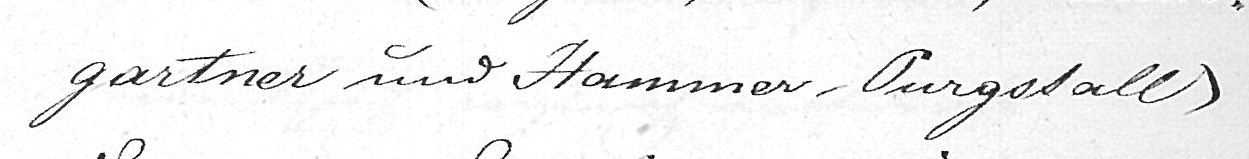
gartner und Hammer-Purgstall)
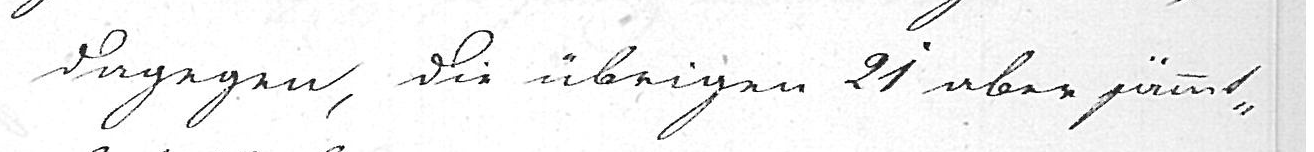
dagegen, die übrigen 21 aber sämmt-
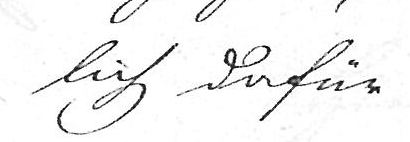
lich dafür.
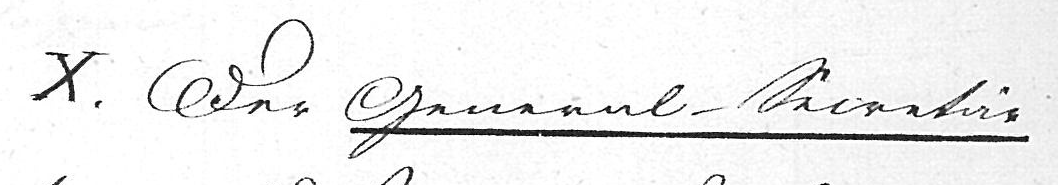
X. Der General-Secretär
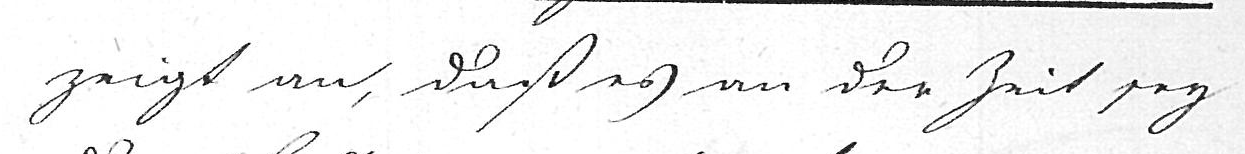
zeigt an, daß es an der Zeit sey
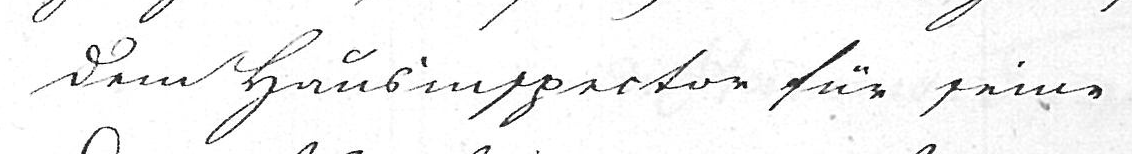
dem Hausinspector für seine
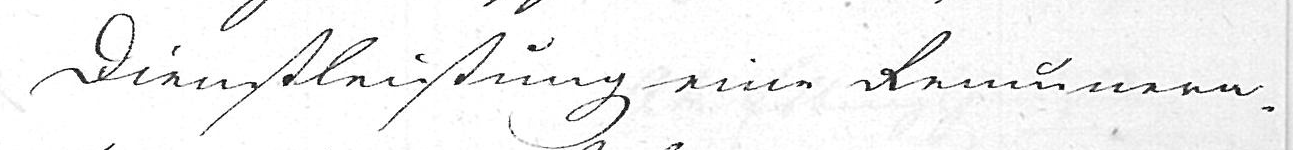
Dienstleistung eine Remunera-
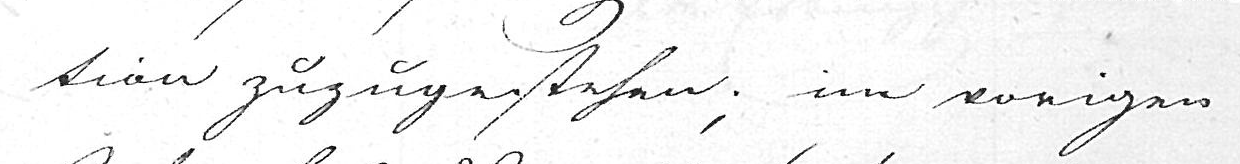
tion zuzugestehen; im vorigen
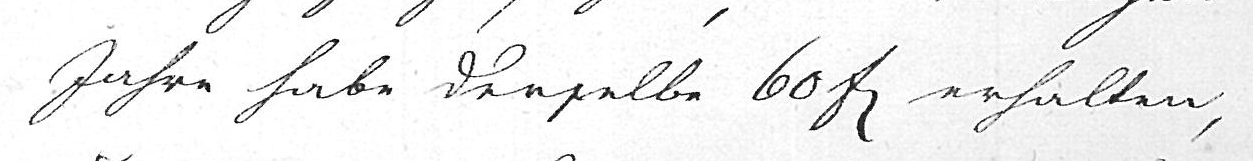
Jahre habe derselbe 60 fl. erhalten,
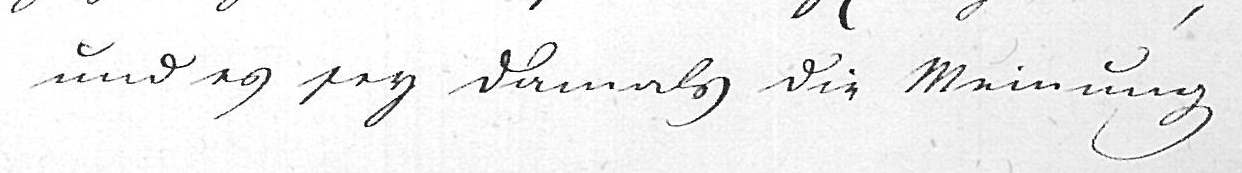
und es sey damals die Meinung
